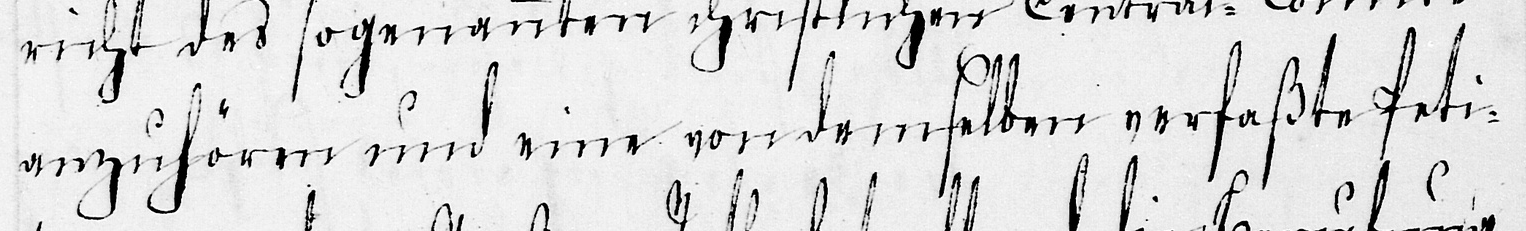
anzuhören und eine von demselben verfaßte Peti¬
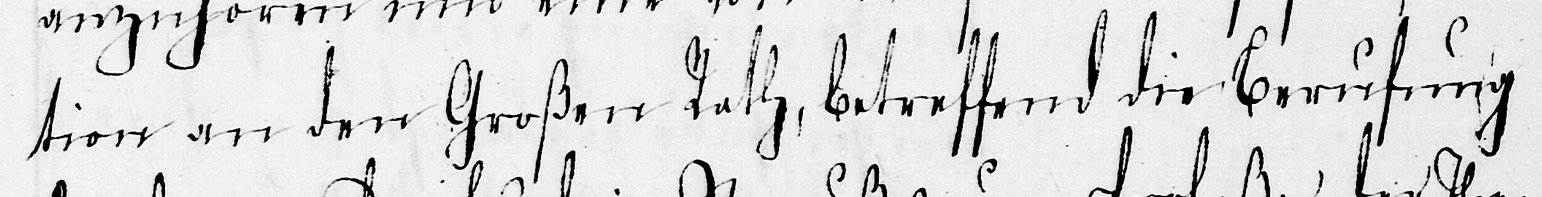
tion an den Großen Rath, betreffend die Berufung
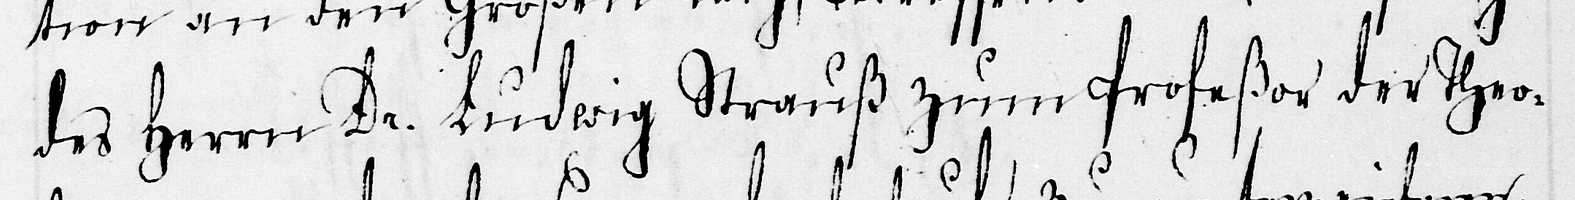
des Herrn Dr. Ludwig Strauß zum Profeßor der Theo¬
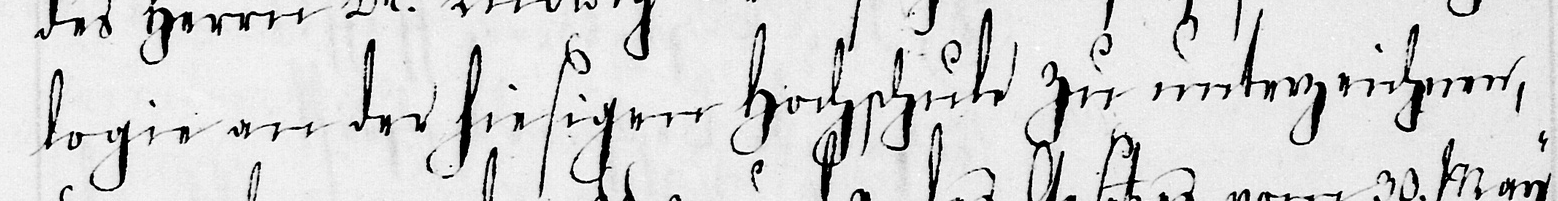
logie an der hiesigen Hochschule zu unterzeichnen,
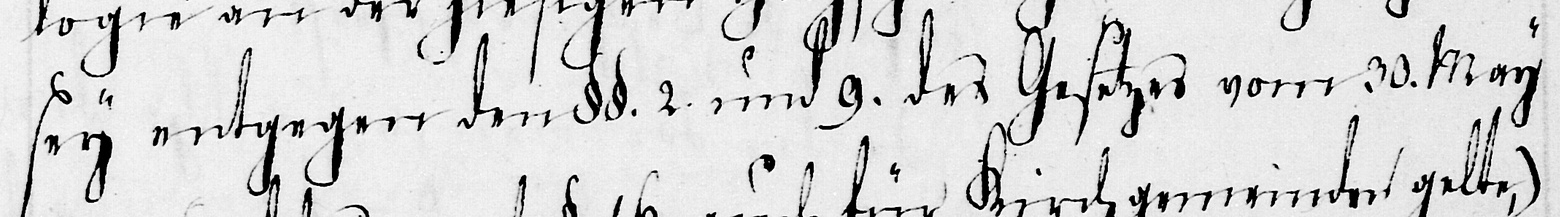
sey entgegen den §§. 2. und 9. des Gesetzes vom 30. May
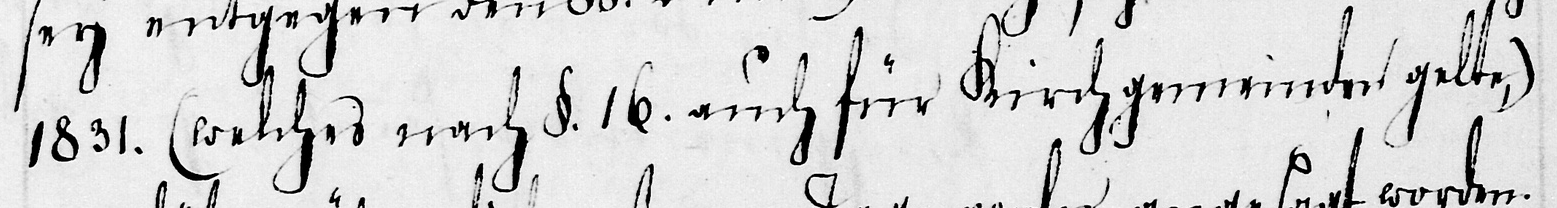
1831. (welches nach §. 16. auch für Kirchgemeinden gelte,)
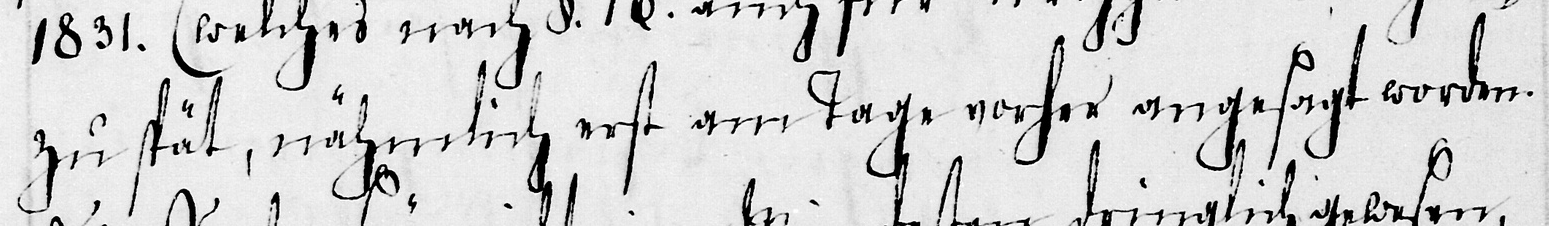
zu spät, nähmlich erst am Tage vorher angesagt worden.
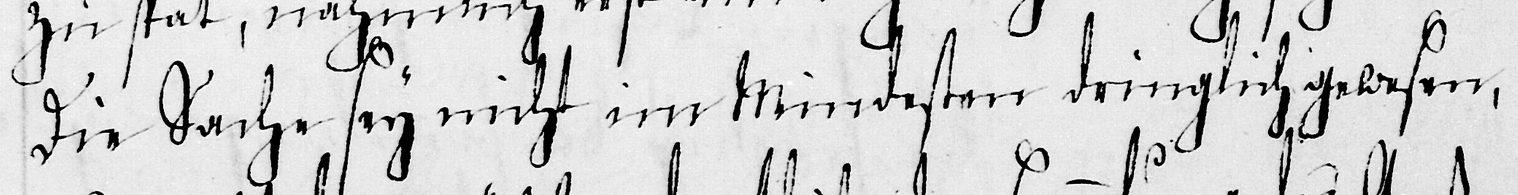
Die Sache sey nicht im Mindesten dringlich gewesen,
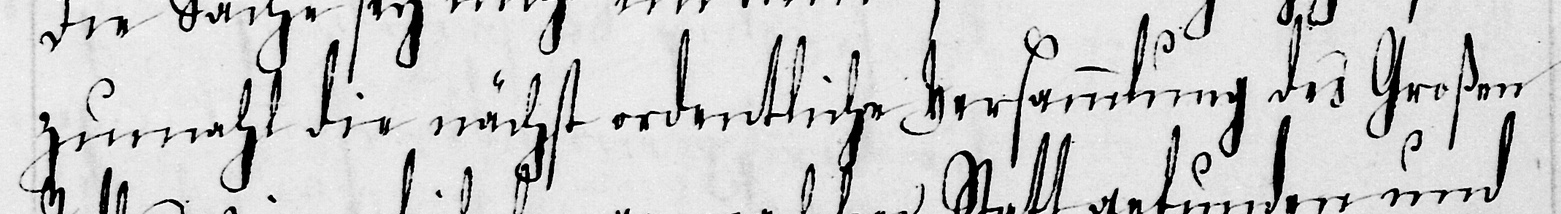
zumahl die nächst ordentliche Versammlung des Großen
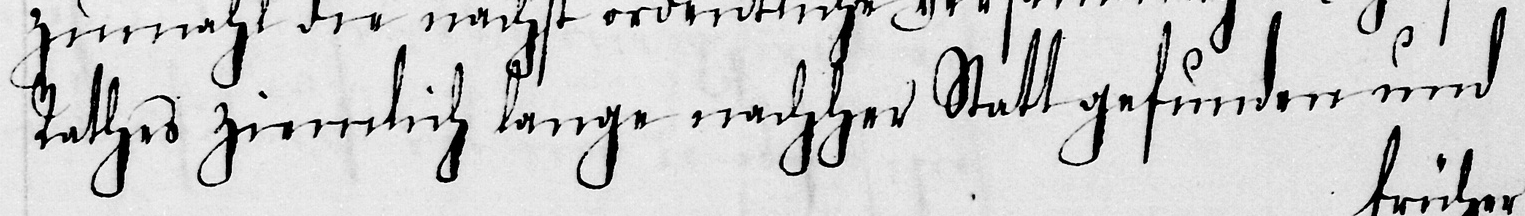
Rathes ziemlich lange nachher Statt gefunden und
